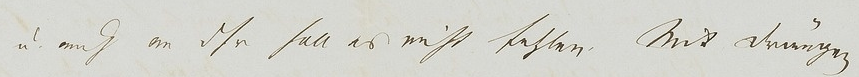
u. auch an dieser soll es nicht fehlen. Mit Drängen
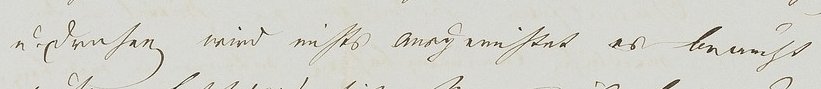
u. Drohen wird nichts ausgerichtet es braucht
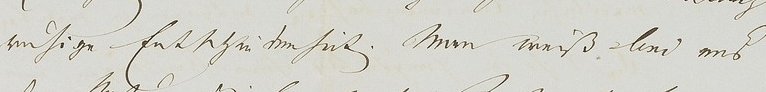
ruhige Entschiedenheit. Man weiß bei uns
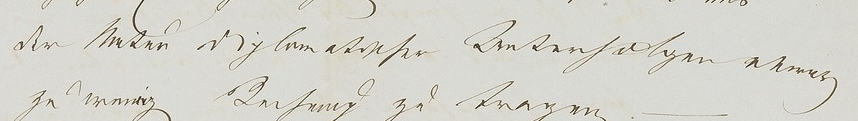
der Natur diplomatischer Unterhandlungen etwas
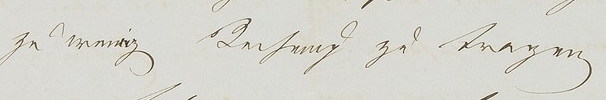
zu wenig Rechnung zu tragen. –
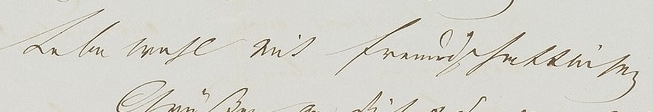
Lebe wohl mit freundschaftlichen
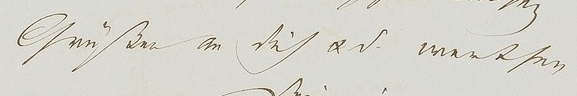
Grüßen an dich & d. werthen
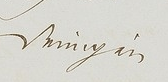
deinigen
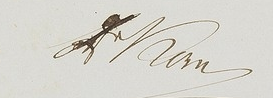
Dr Kern
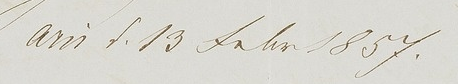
Paris d. 13 Febr. 1857.
